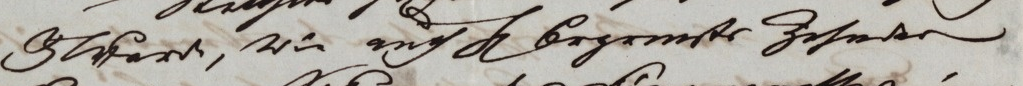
& wurde, wie auch Herr Brgrmstr Zehnder
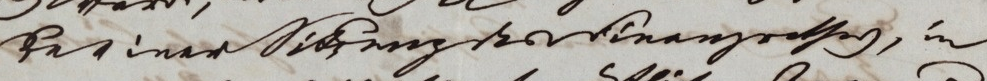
zu einer Sitzung des Finanzrathes, in
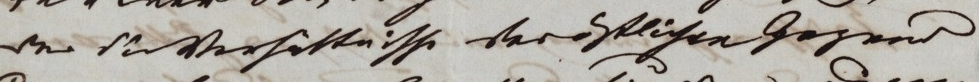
der die Verhältnisse der östlichen Gegend
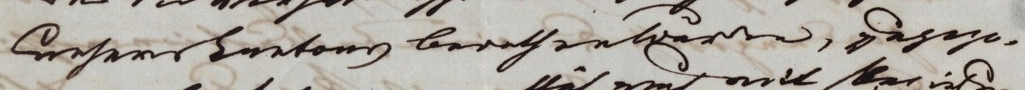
unseres Cantons berathen wurden, zugezo-
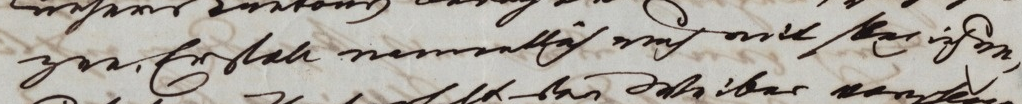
gen. Er soll namentlich auch mit Beziehung
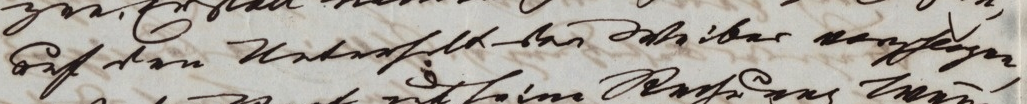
auf den Unterhalt der Weiber vorschlagen,
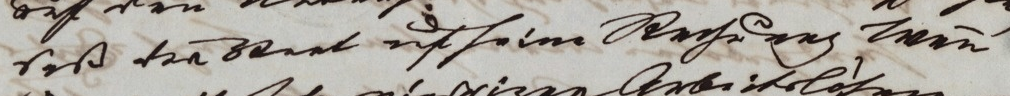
daß der Staat auf seine Rechnung, wenn
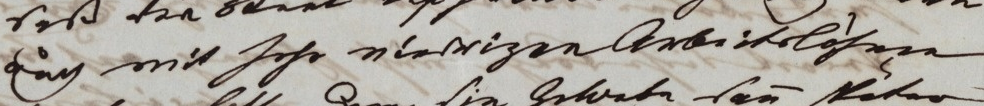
auch mit sehr niedrigen Arbeitslöhnen
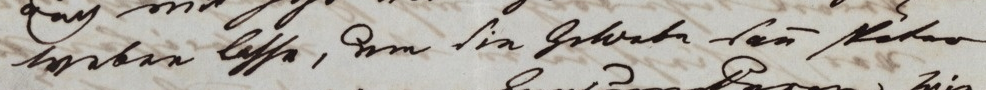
weben lasse, um die Gewebe dann später
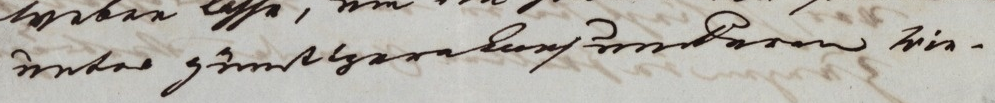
unter günstigern Conjuncturen wie-
